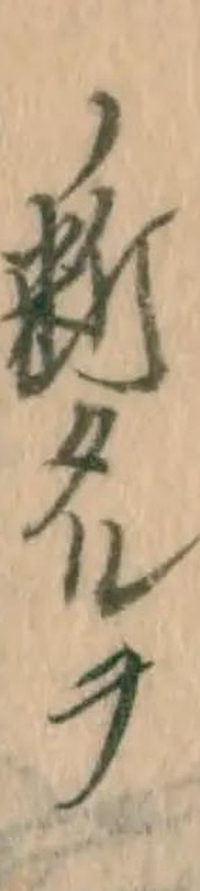ノ断タルヲ
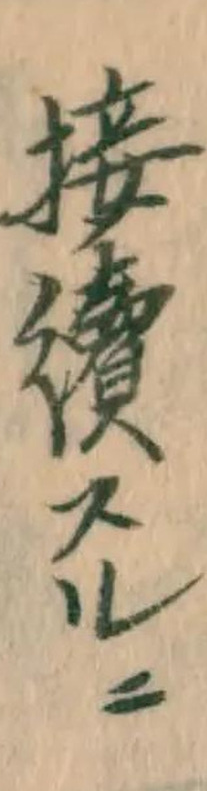接續スルニ
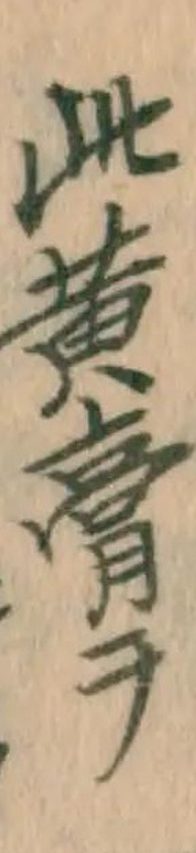此黄膏ヲ
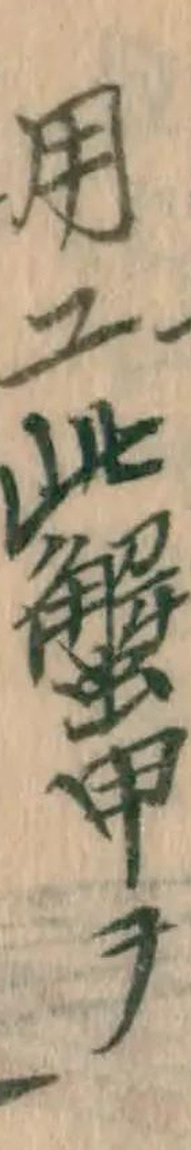用ユ此蟹甲ヲ
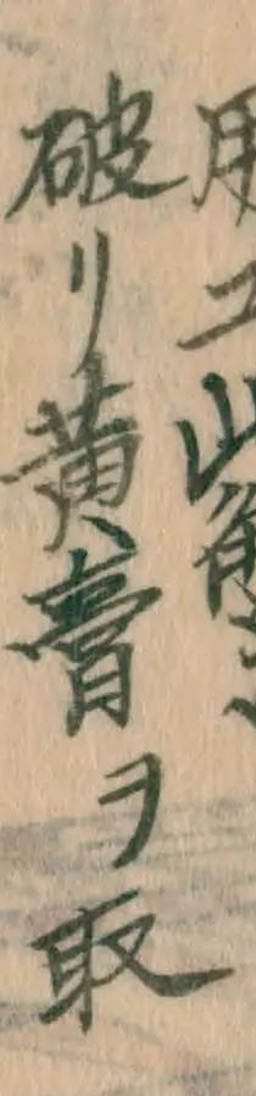破リ黄膏ヲ取
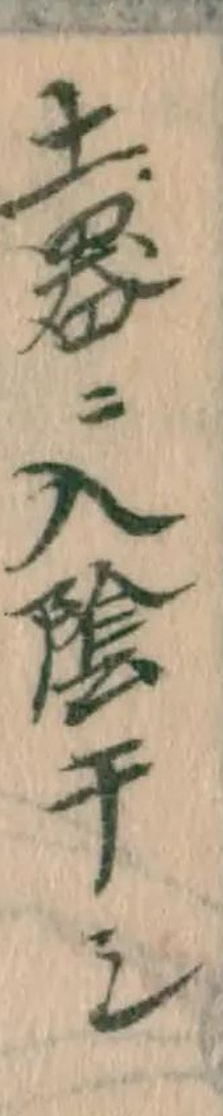土器ニ入陰干シ
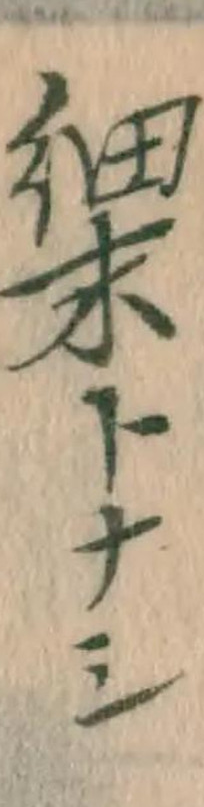細末トナシ
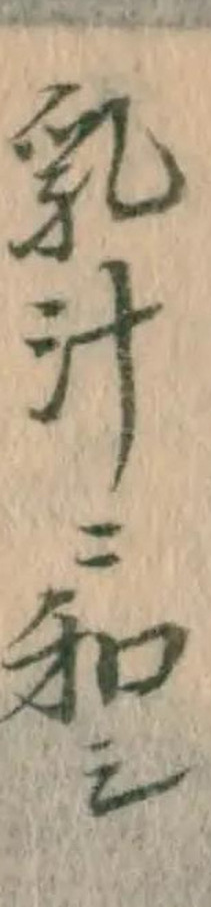乳汁ニ和シ
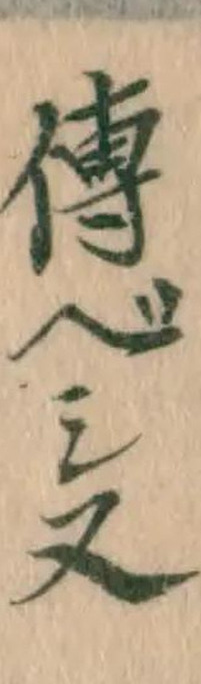傅ベシ又
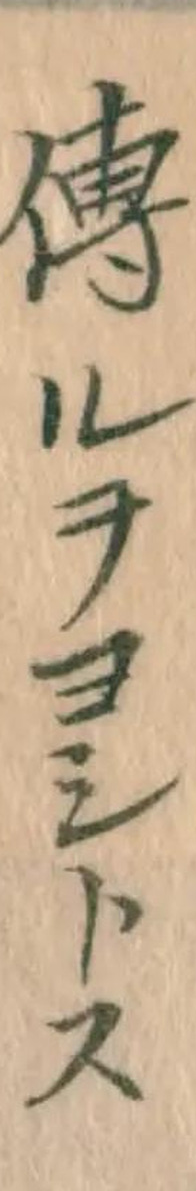傅ルヲヨシトス
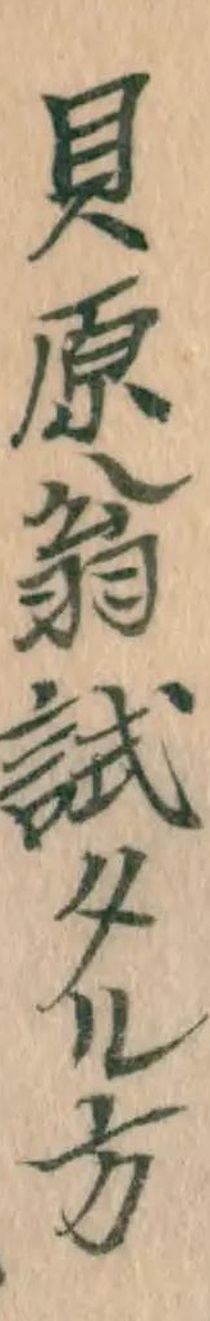貝原翁試タル方
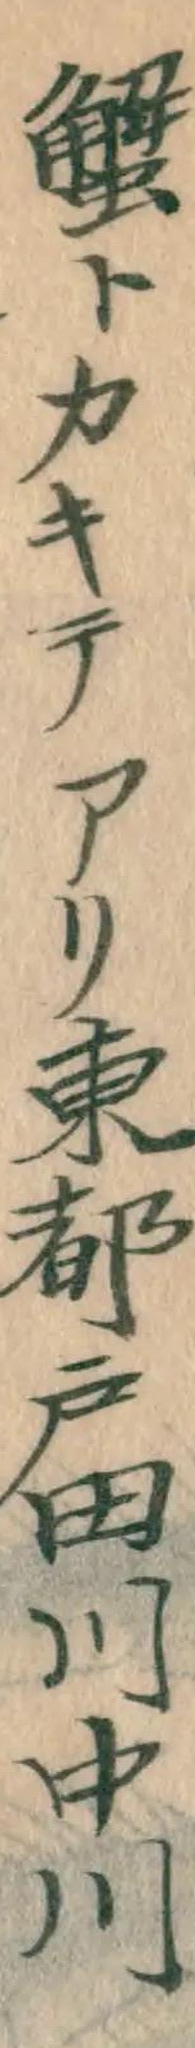蟹トカキテアリ東都戸田川中川
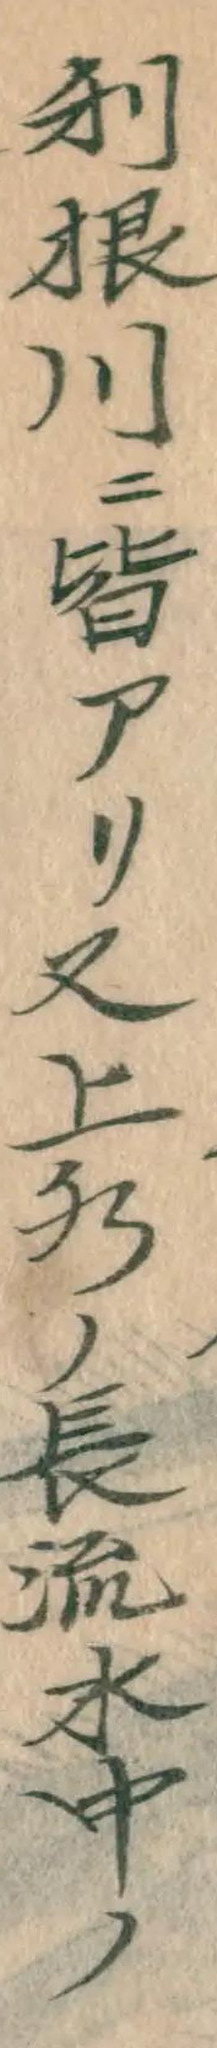利根川ニ皆アリ又上水ノ長流水中ノ
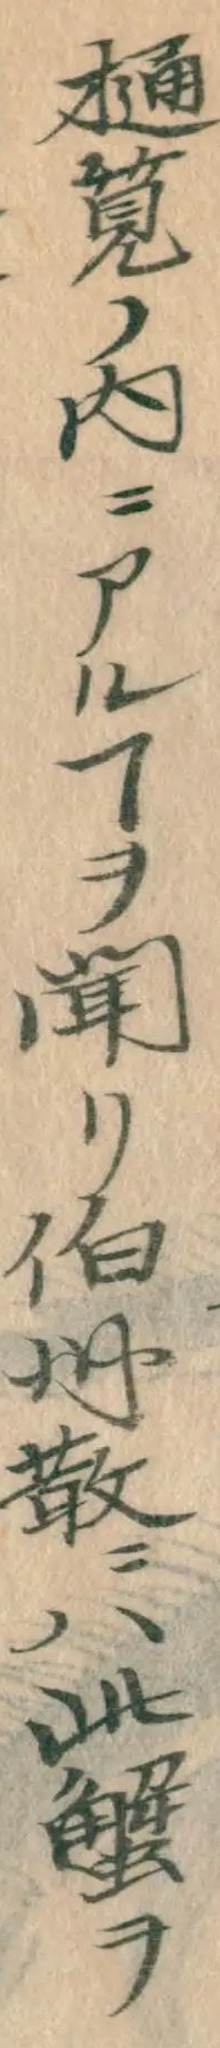樋筧ノ内ニアルコトヲ聞リ伯州散ニハ此蟹ヲ
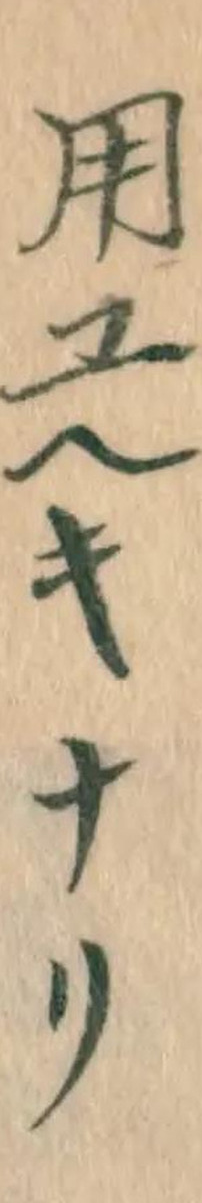用ユヘキナリ

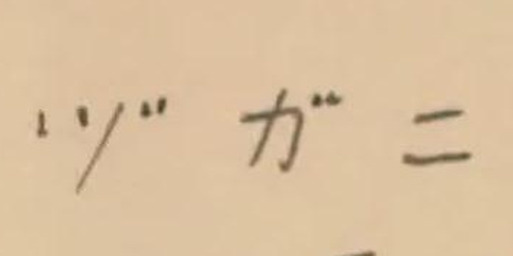ヅガニ
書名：千蟲譜 3巻. [2]
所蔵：国立国会図書館 National Diet Library, JAPAN
